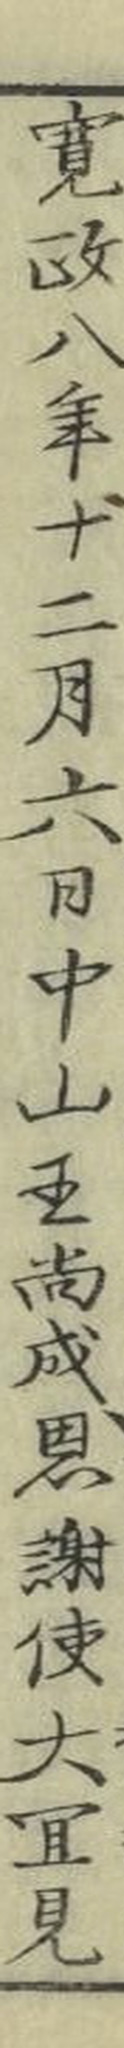寛政八年十二月六日、中山王尚成、恩謝使大宜見
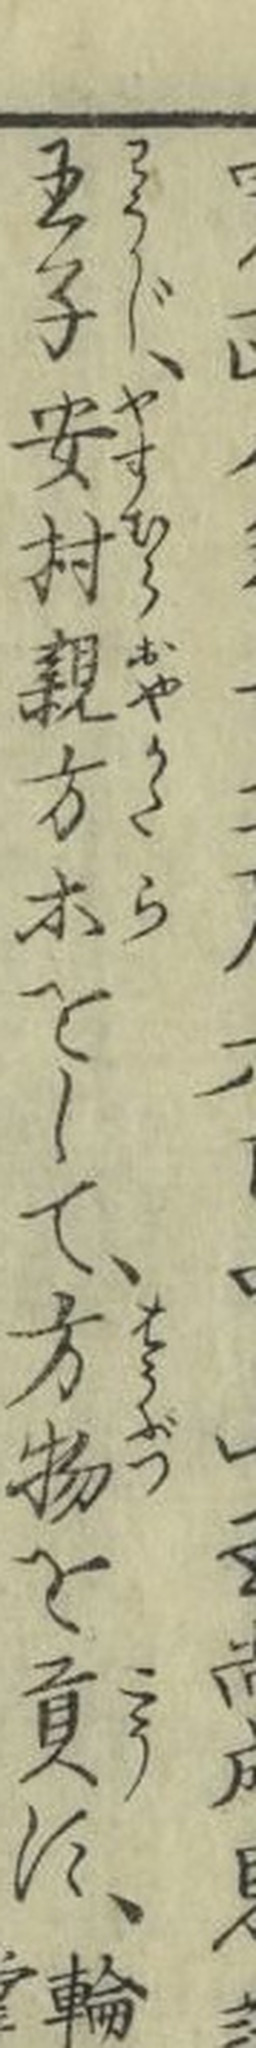山王子小録親方等をして、方物を貢す、
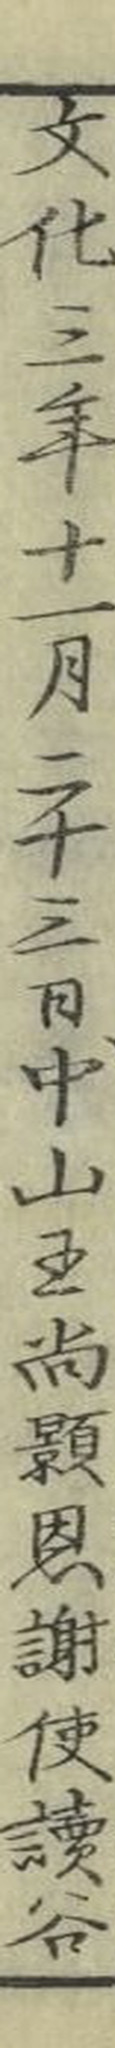文化三年十一月二十三日、中山王尚顥、恩謝使読谷
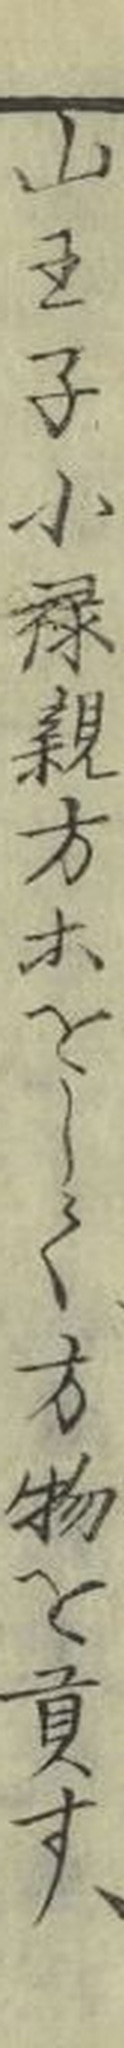山王子小録親方等をして、方物を貢す、
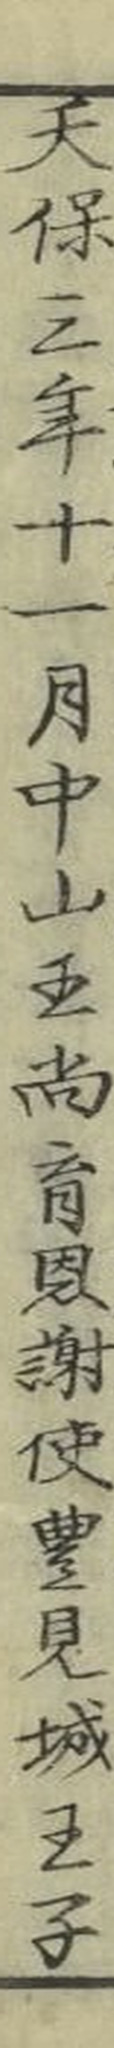天保三年十一月中山王尚育恩謝使豊見城王子
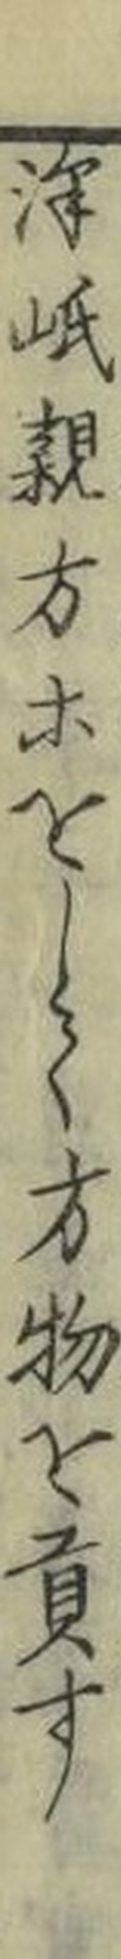沢岻親方等をして方物を貢す

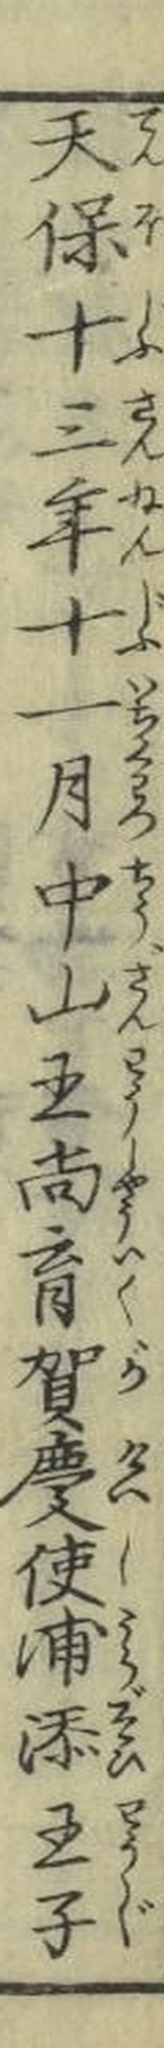天保十三年十一月中山王尚育賀慶使浦添王子
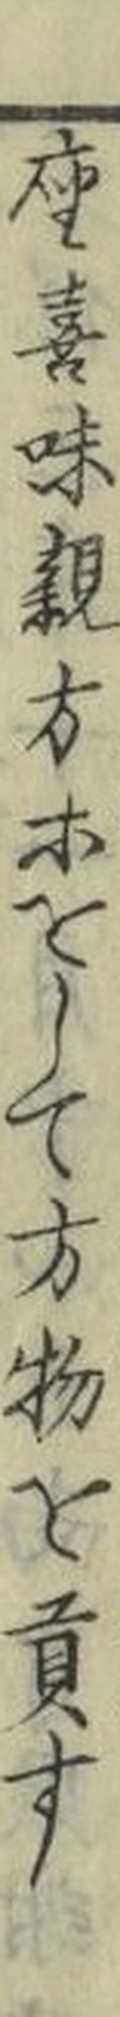座喜味親方等をして方物を貢す
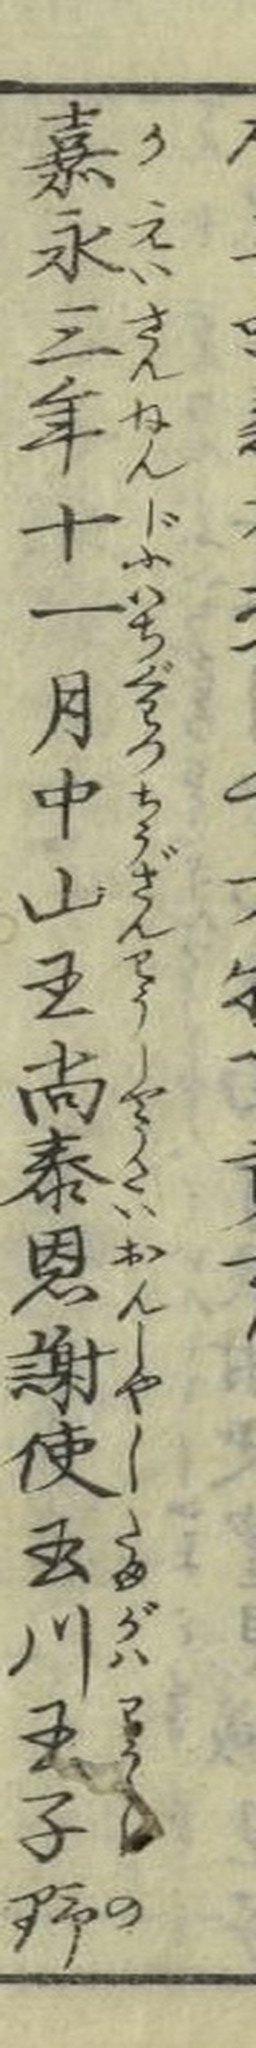嘉永三年十一月中山王尚泰恩謝使玉川王子野
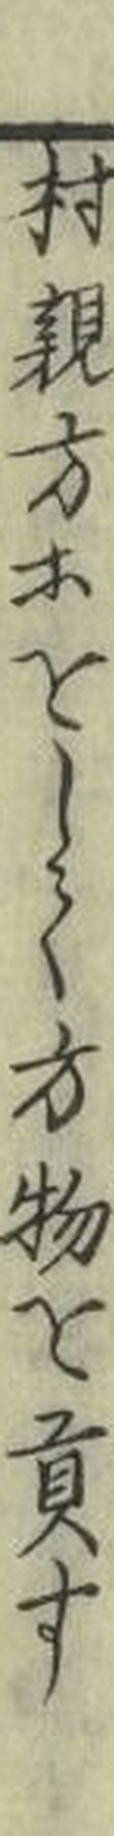村親方等をして方物を貢す
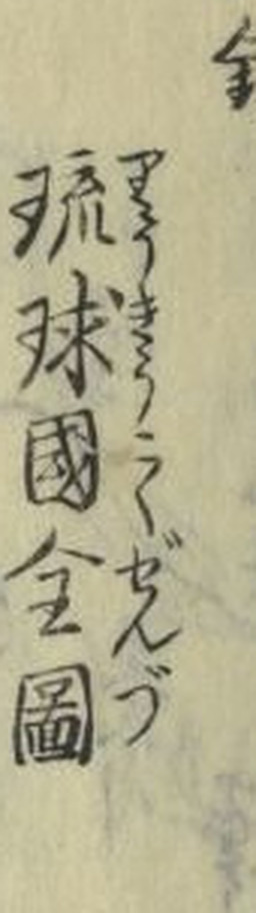琉球国全図
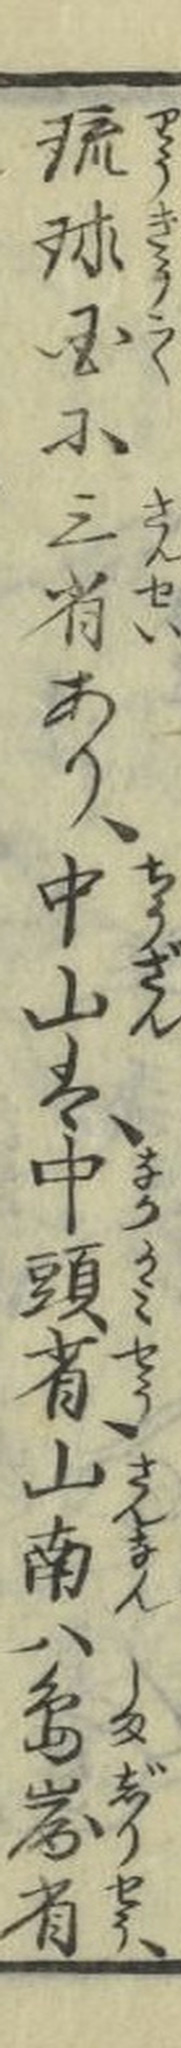琉球国に三省あり、中山は、中頭省、山南は島省、
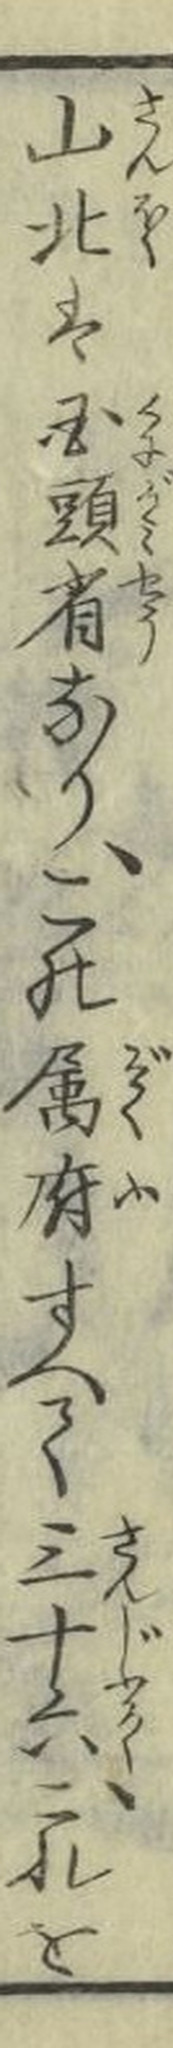山北は国頭省なり、この属府すへて三十六、これを
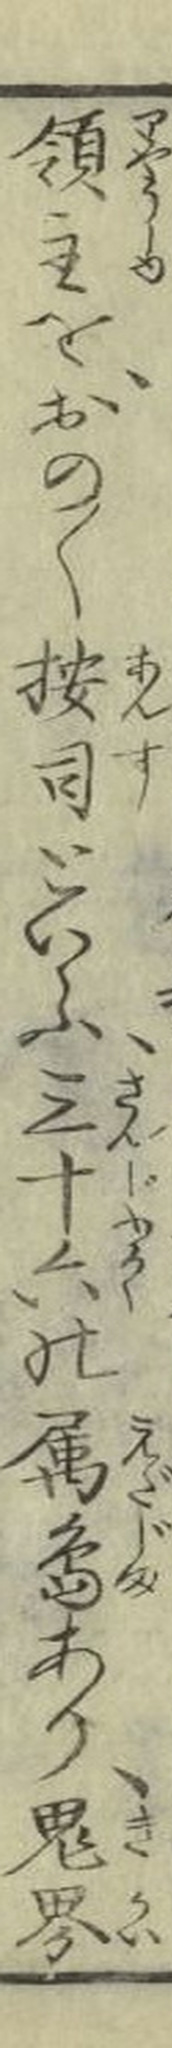領主を、おの〳〵按司といふ、三十六の属島あり、鬼界
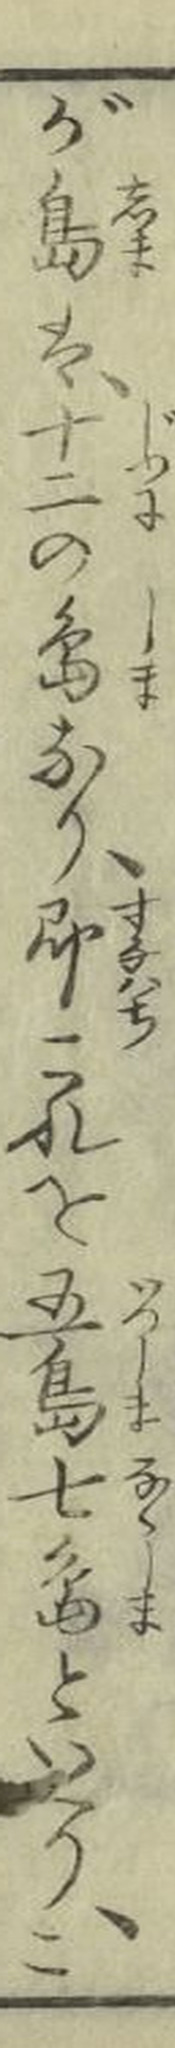が島は、十二の島なり、即これを五島七島といへり、こ
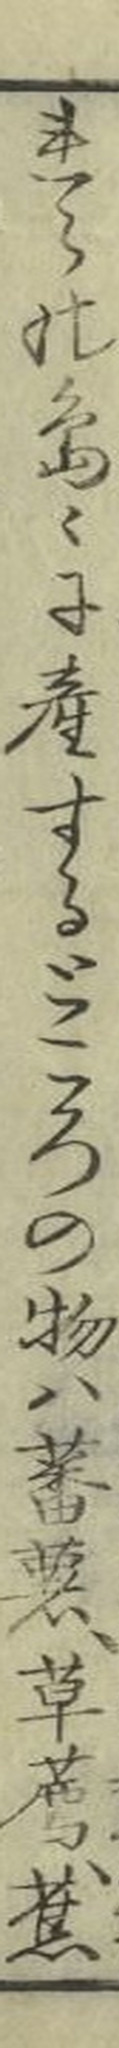れらの島々に、産するところの物は、蕃薯、草薦、蕉
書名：琉球入貢紀略
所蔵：University of the Ryukyus Library
